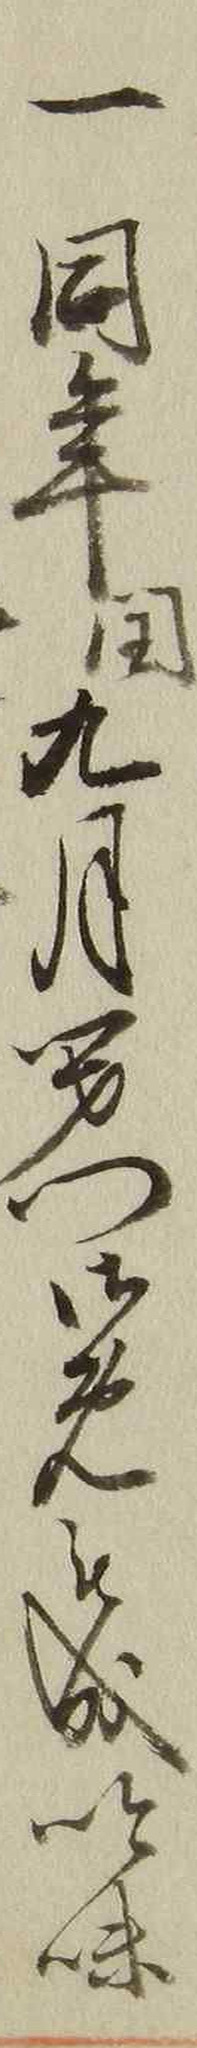一同年閏九月閉門御免被成吟味
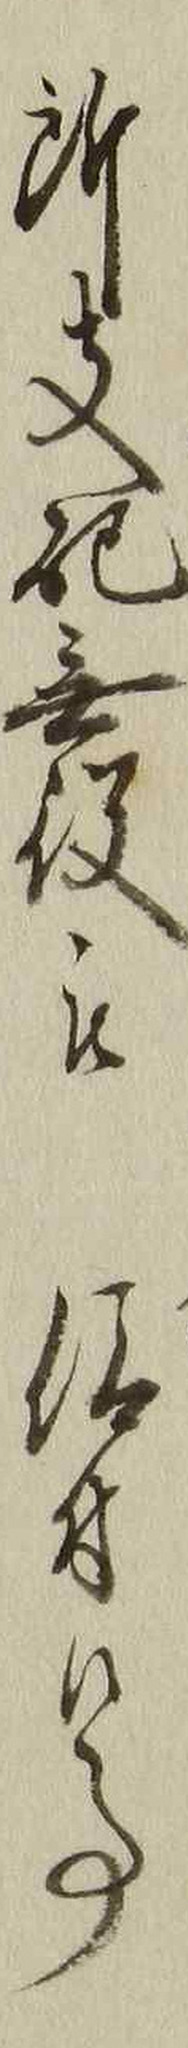所支配無役被仰付候事
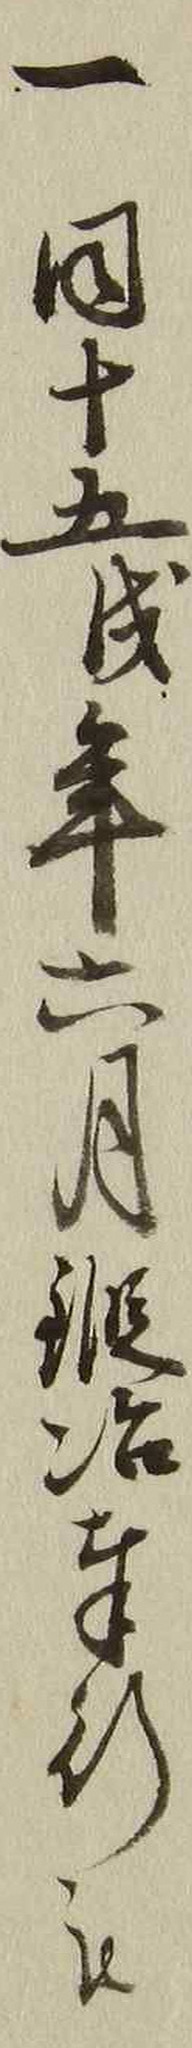一同十五戌年六月鍛冶奉行被
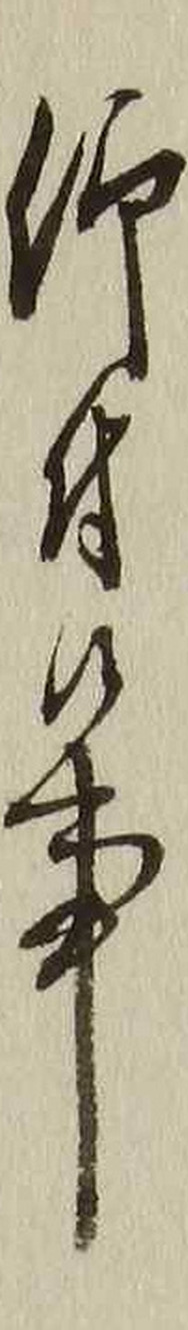仰付候事
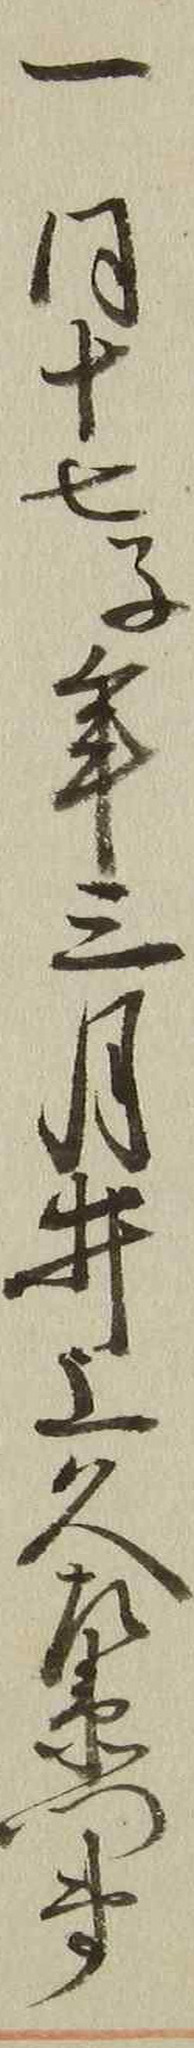一同十七子年三月井上久左衛門弟
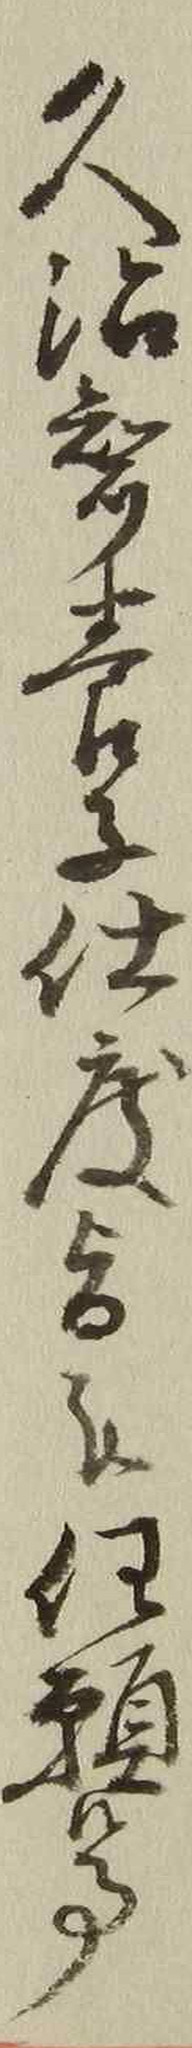久治聟養子仕度旨被任願候事
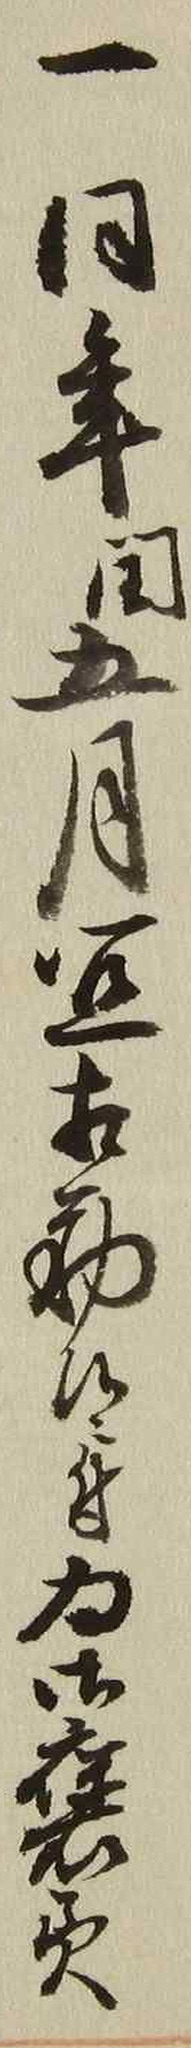一同年閏五月宜相勤候ニ付為御褒美
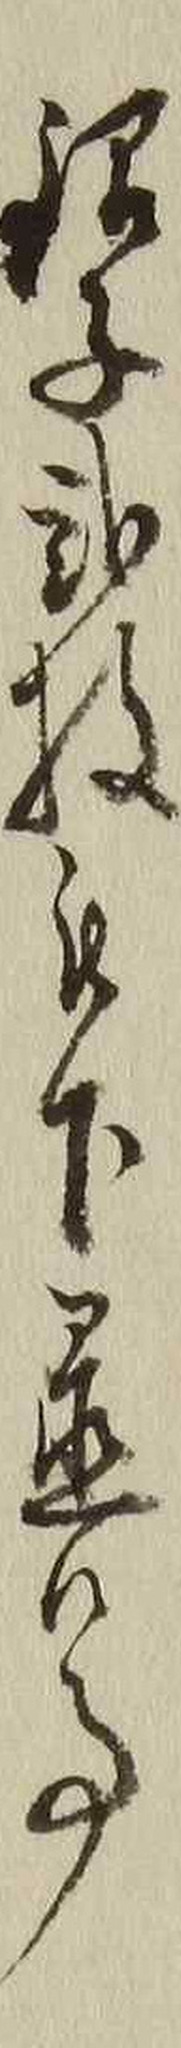銀子弐枚被下置候事
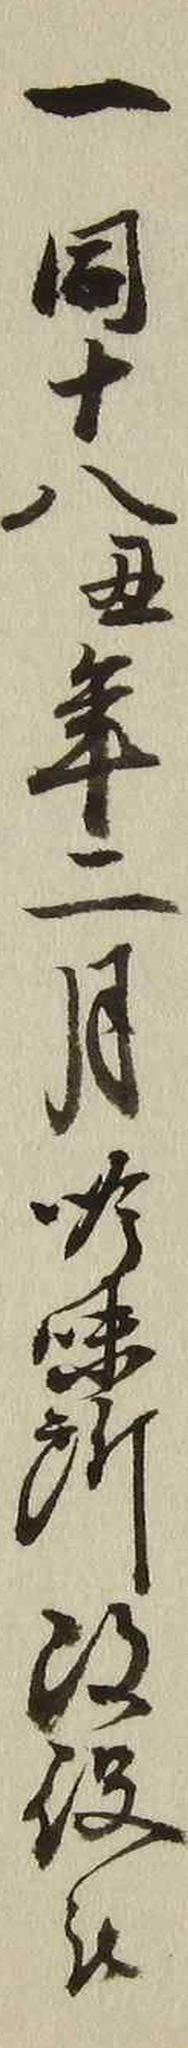一同十八丑年二月吟味所改役被
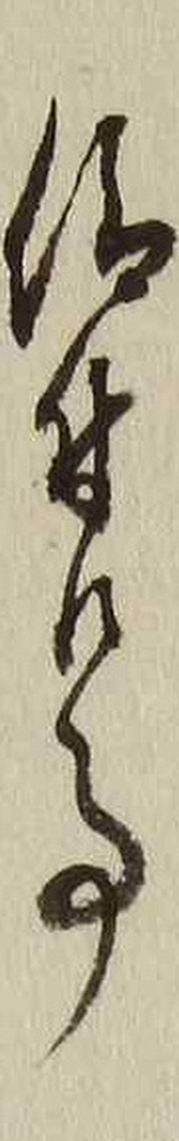仰付候事
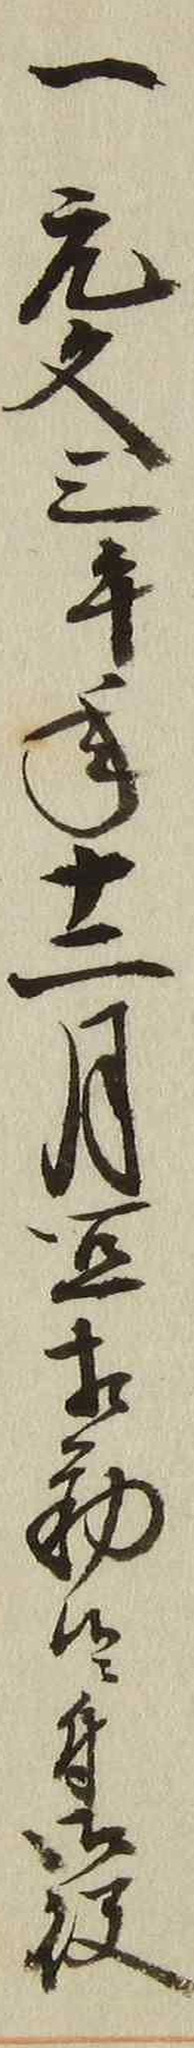一元文三午年十二月宜相勤候ニ付御役
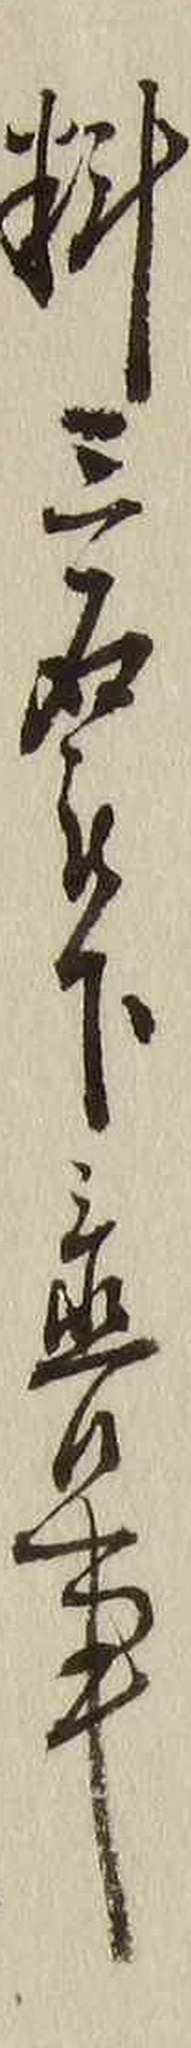料三石被下置候事
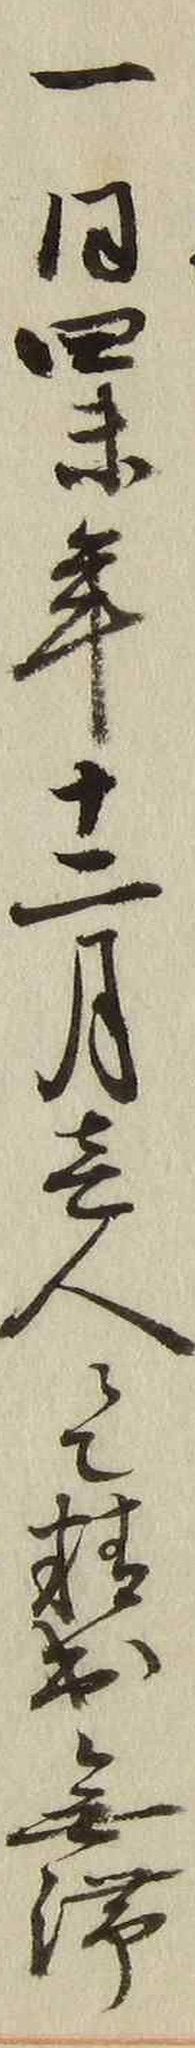一同四未年十二月壱人ニて精出無滞
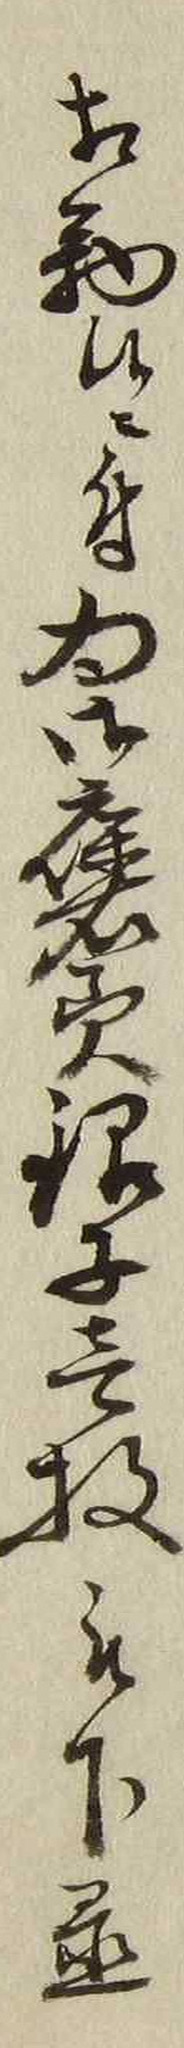相勤候ニ付為御褒美銀子壱枚被下置
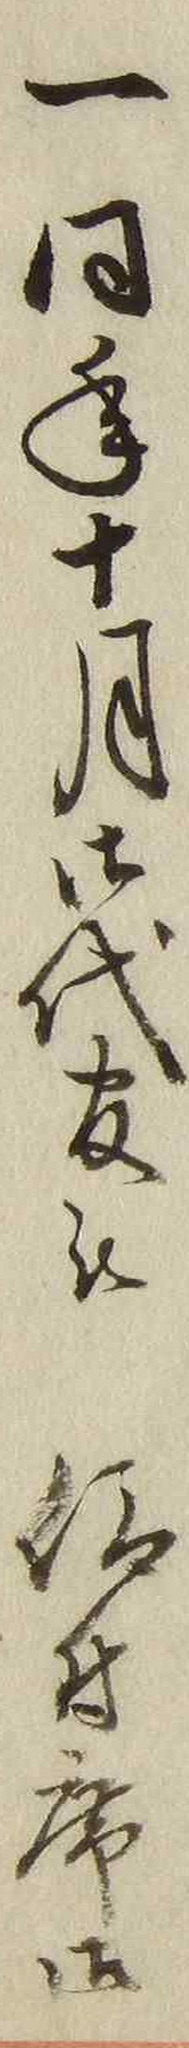一同年十月御代官被仰付席御

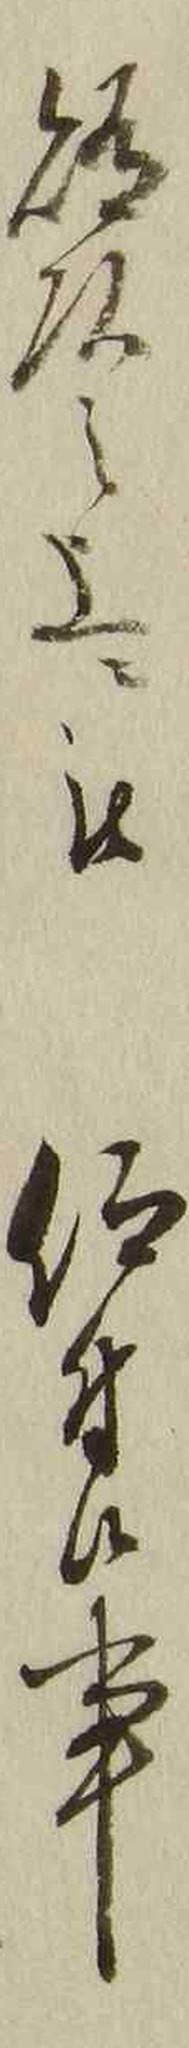賄頭之上ニ被仰付候事
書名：諸士系譜　巻之27　い之部27
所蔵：会津若松市立会津図書館
